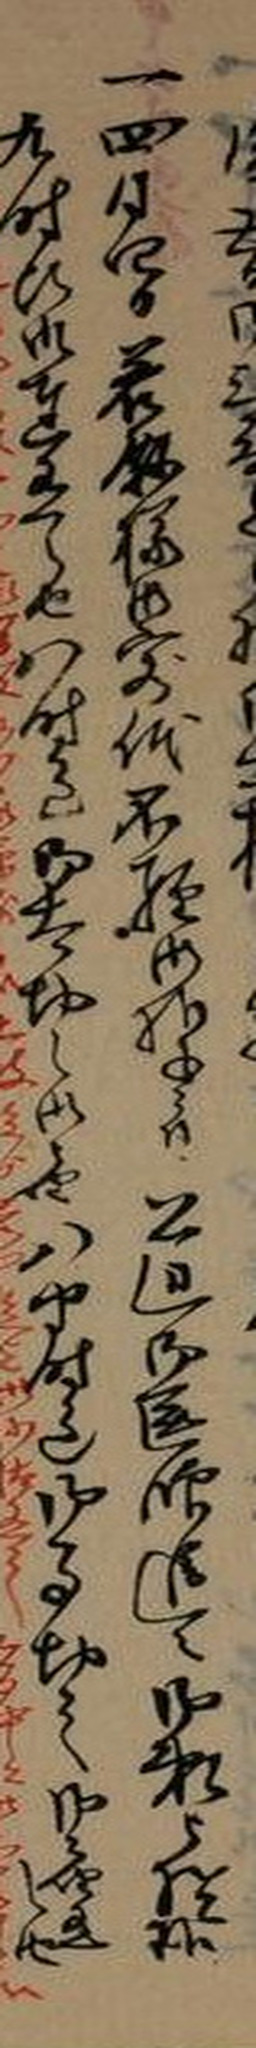九時頃御達有之候由八時過御大切之御届八半時過御事切之御届有之由
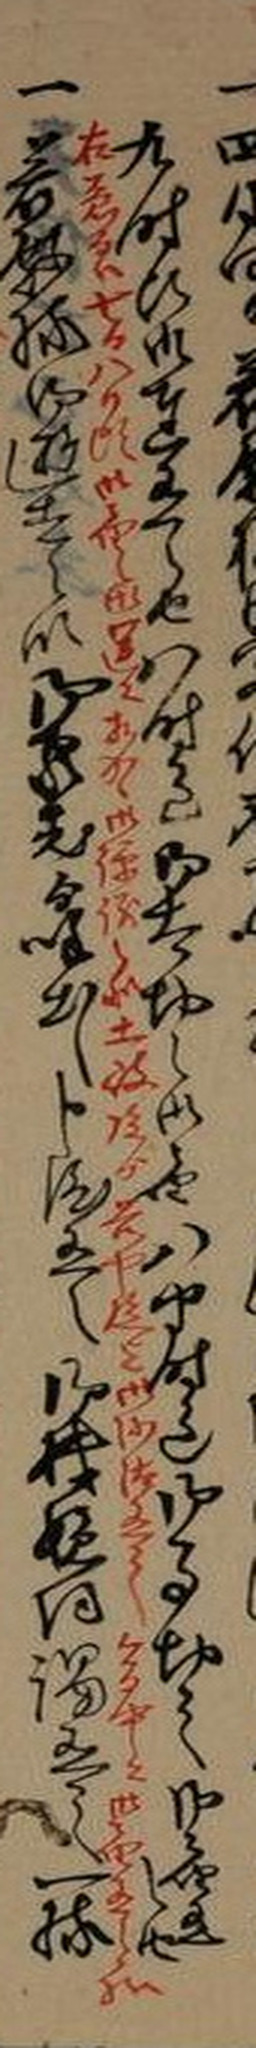一若殿様御逝去之段御家老ゟ呼出し申渡有之御機嫌伺謁有之一統
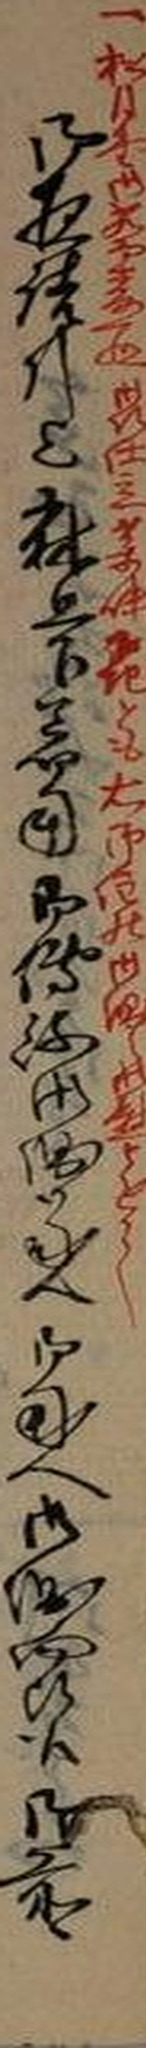御夜詰引迄麻上下着用御傅役御側御用人御用人御側向頭取御前へ
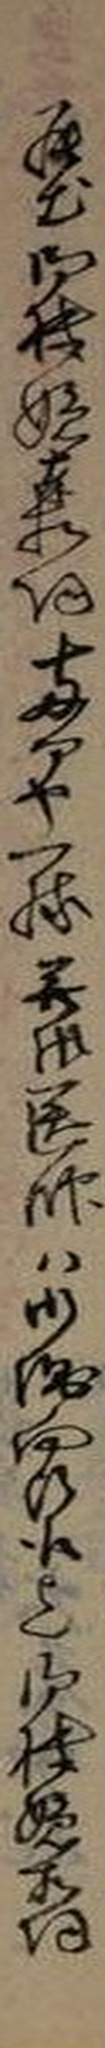罷出御機嫌奉相伺両部や一統并御医師ハ御側向頭取迄御機嫌相伺
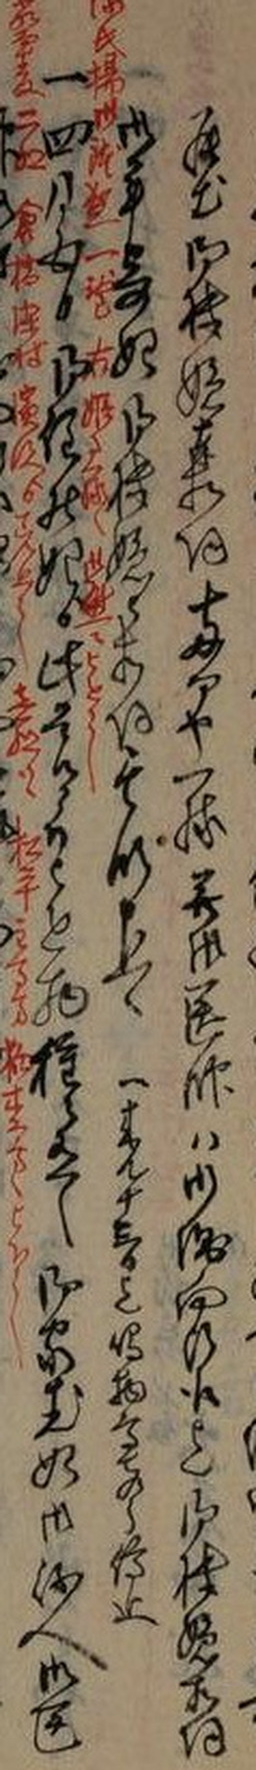御年寄始御機嫌被相伺其段申上候一来ル十三日迄鳴物高声停止
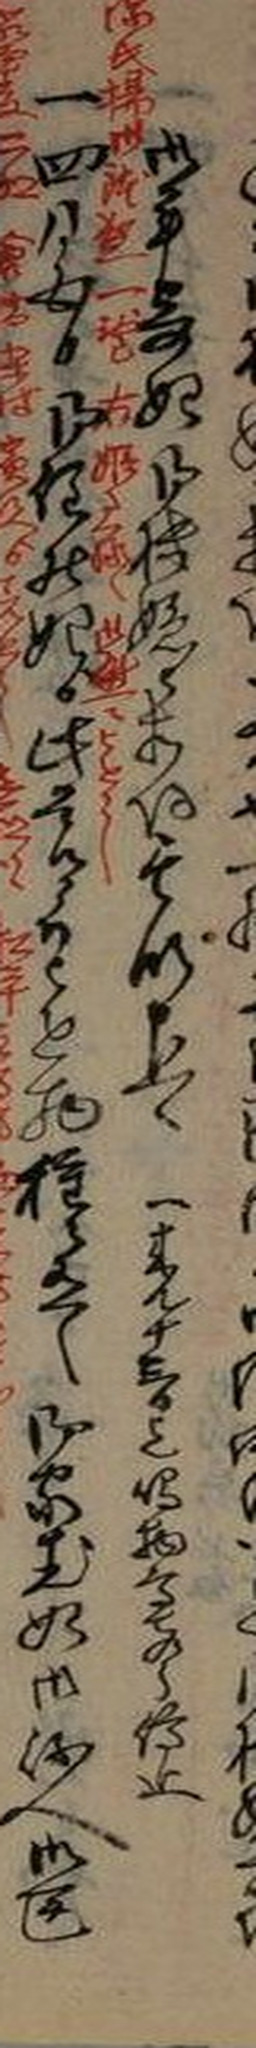一四月五日御住居始ゟ此節ニ付被進物種々有之御家老始御役人御医
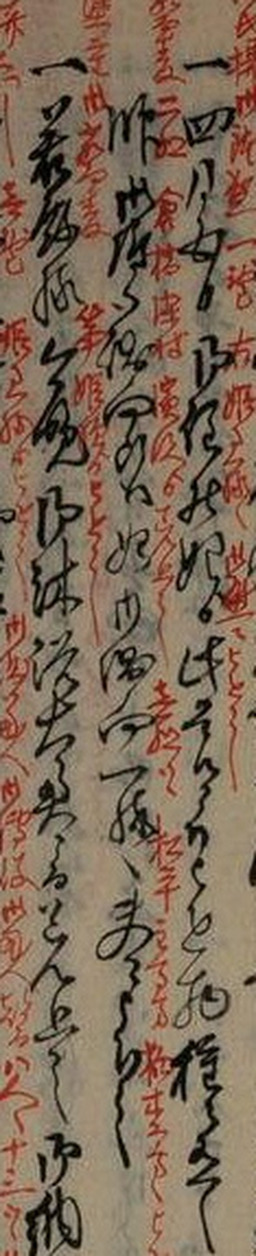師御附御側向頭取始御側向一統へ夫々被下之
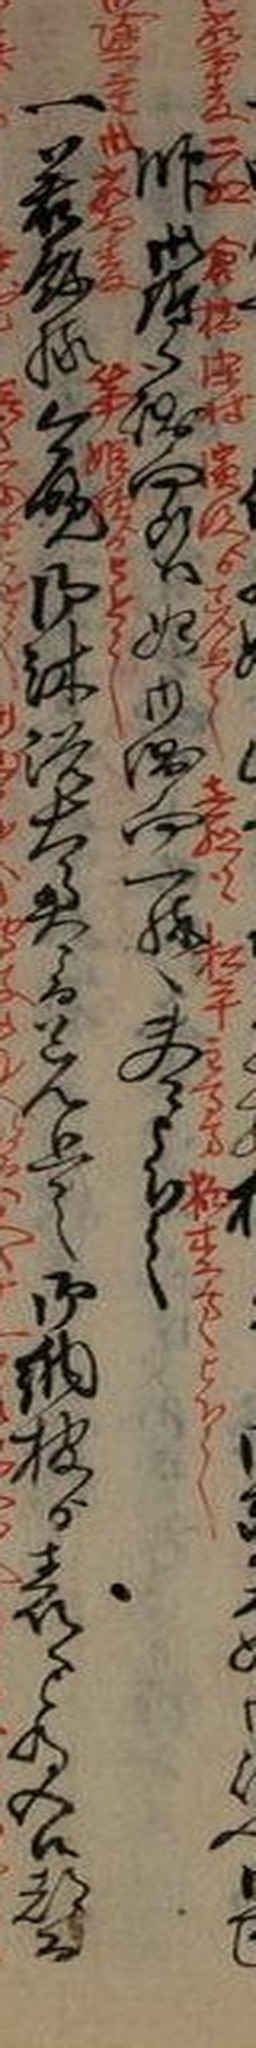一若殿様今晩御沐浴大奥ニ而差上之御納棺ゟ表へ被為入候都而
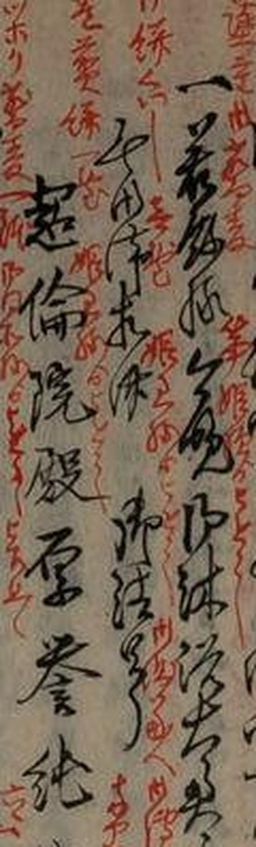無御滞相済御法号
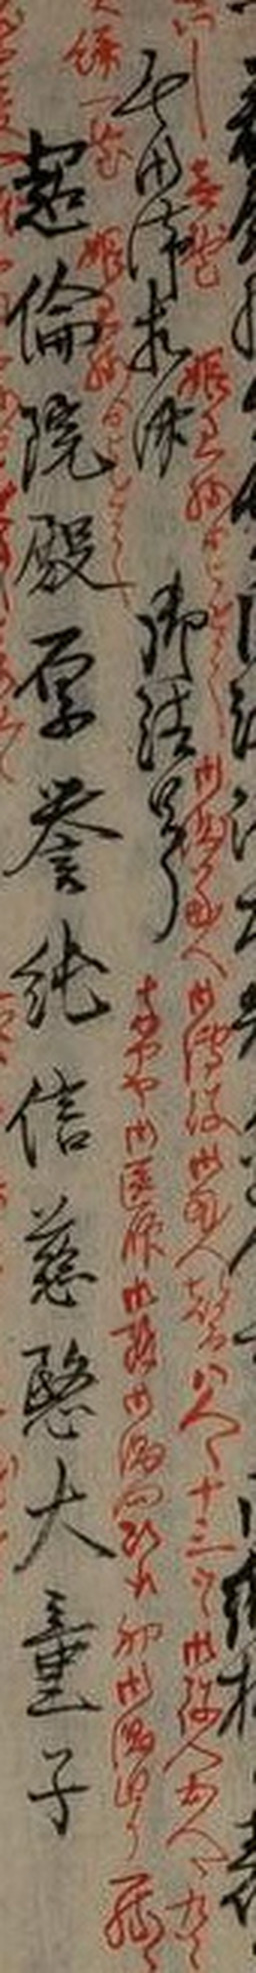超倫院殿厚誉純信慈愍大童子
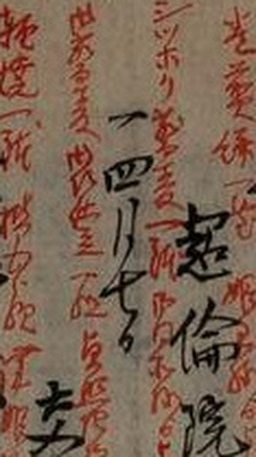一四月七日
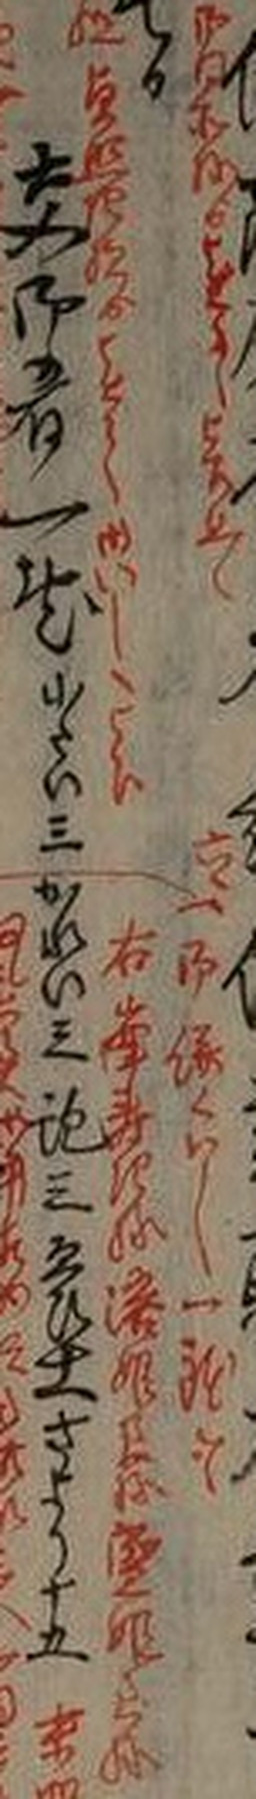交御肴一台小たい三かれい三鮑三ゑひ十一さより十五
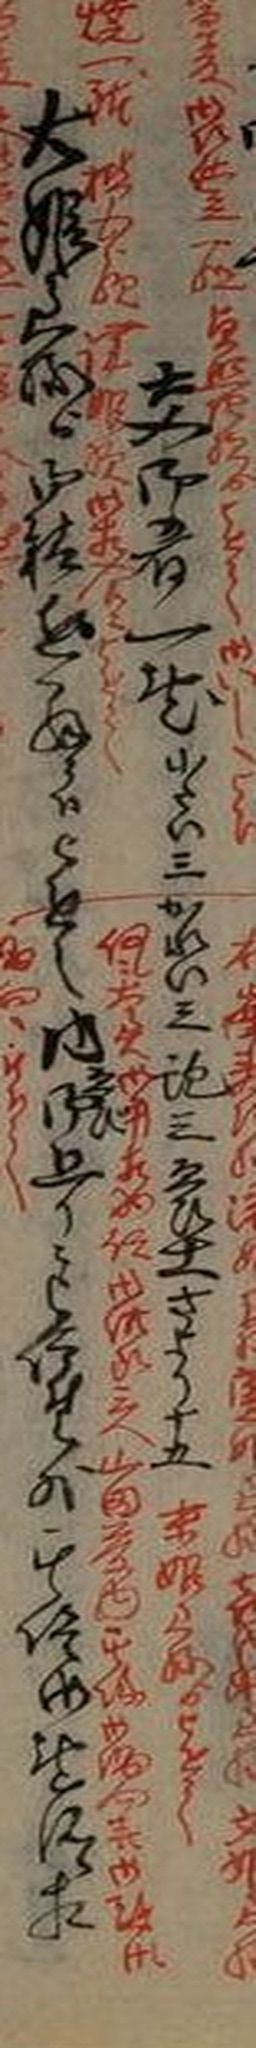右姫君様ゟ御精進解ニ付被進之内ゑひ御上りニ被仰付候外其侭御台所へ相
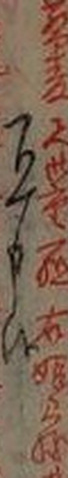下ケ申候
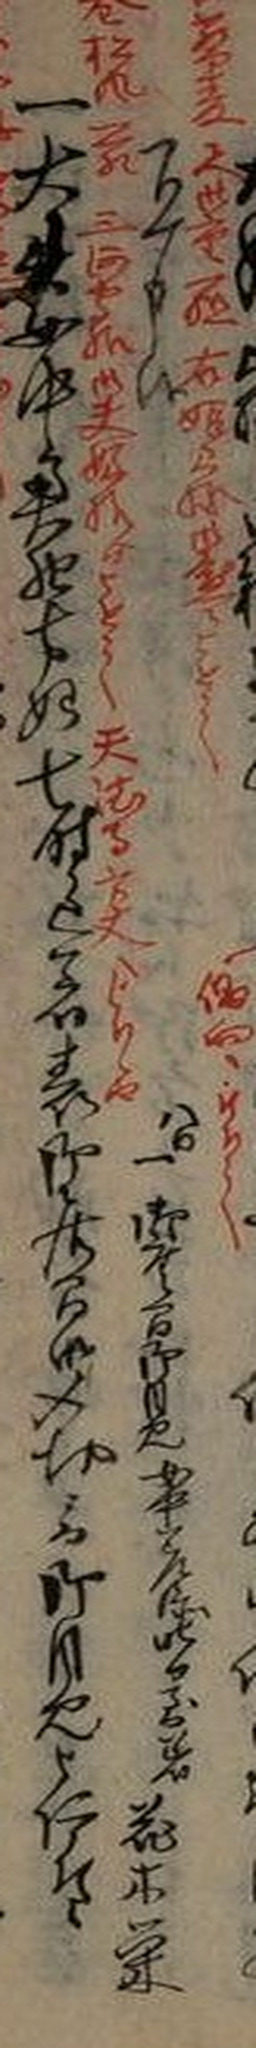一大奥女中奥野方始七時過着表御居間御〆切ニ而御目見被仰付候
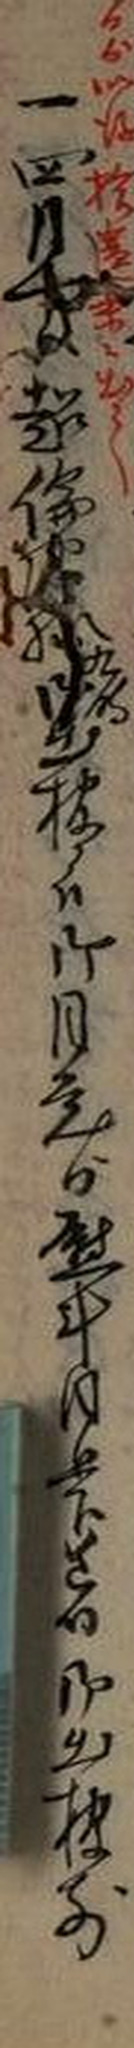一四月十日超倫院様九時御出棺ニ付御目覚ゟ熨斗目上下着御出棺前
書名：少傅日録抄（斉承付側向頭取日記、在府）
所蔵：福井県文書館 Fukui Prefectural Archives
